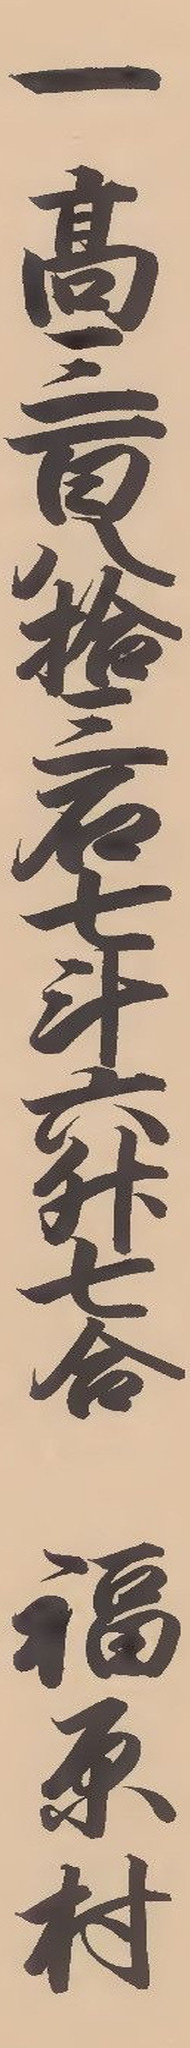一高三百八拾三石七斗六升七合福原村
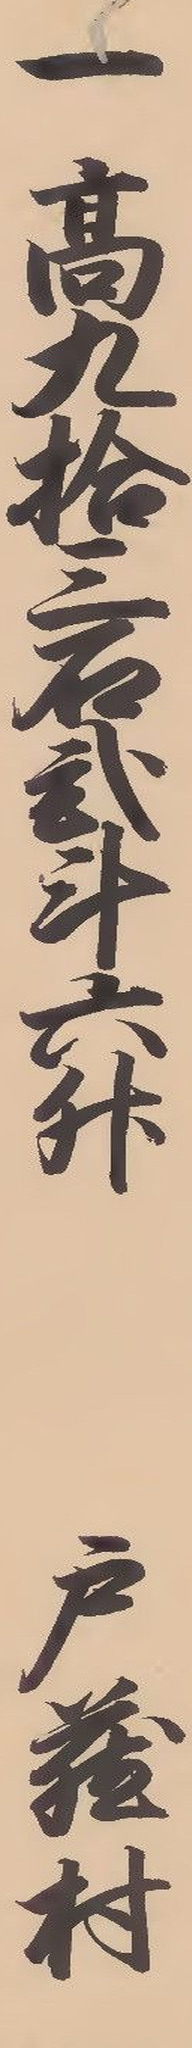一高九拾三石弐斗六升戸蔵村
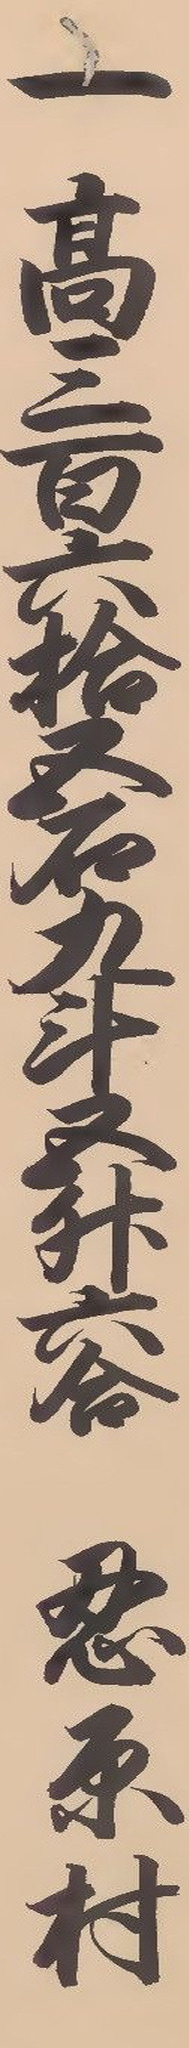一高三百六拾五石九斗五升六合忍原村
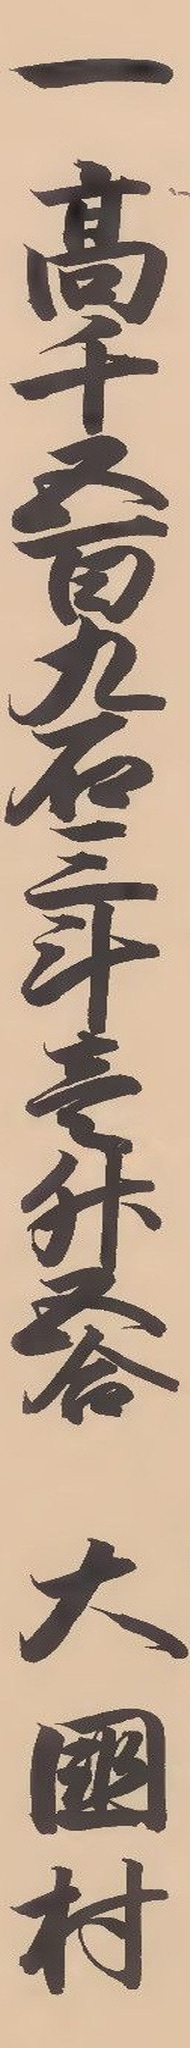一高千五百九石三斗壱升五合大国村
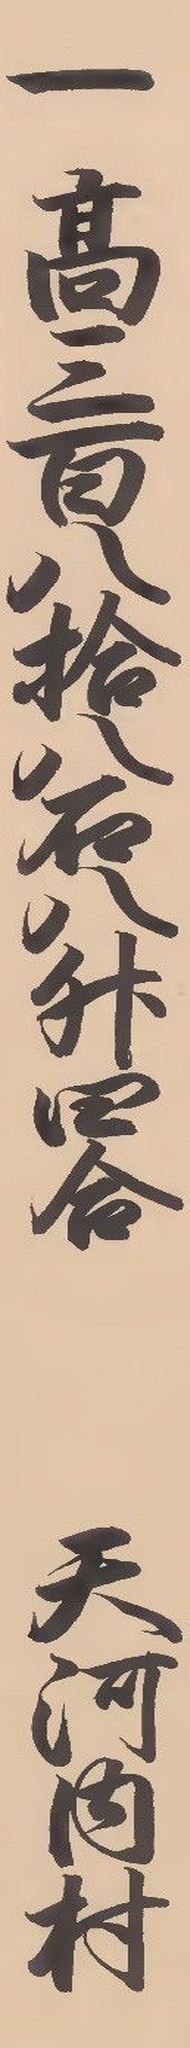一高三百八拾八石八升四合天河内村
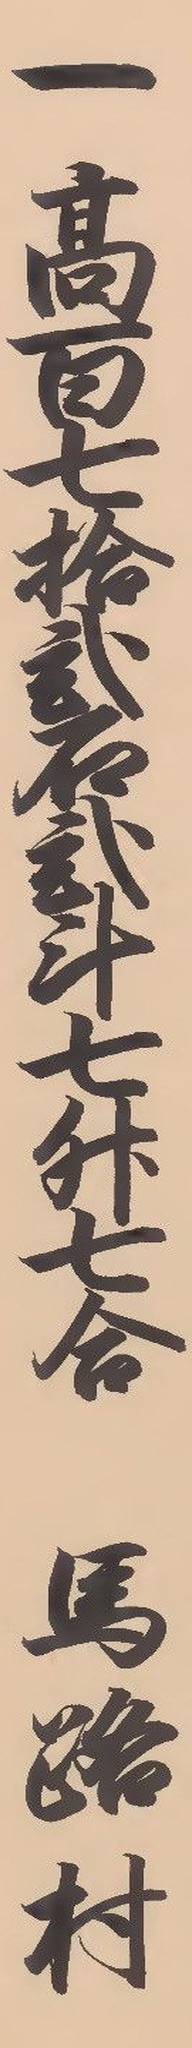一高百七拾弐石弐斗七升七合馬路村

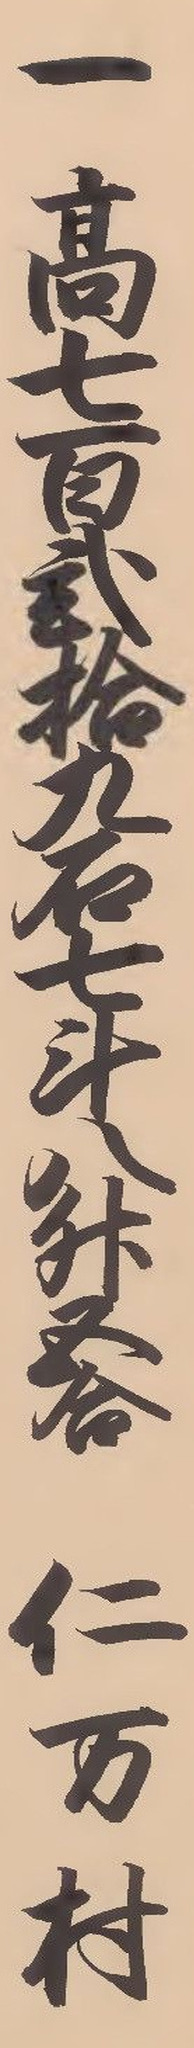一高七百弐拾九石七斗八升五合仁万村
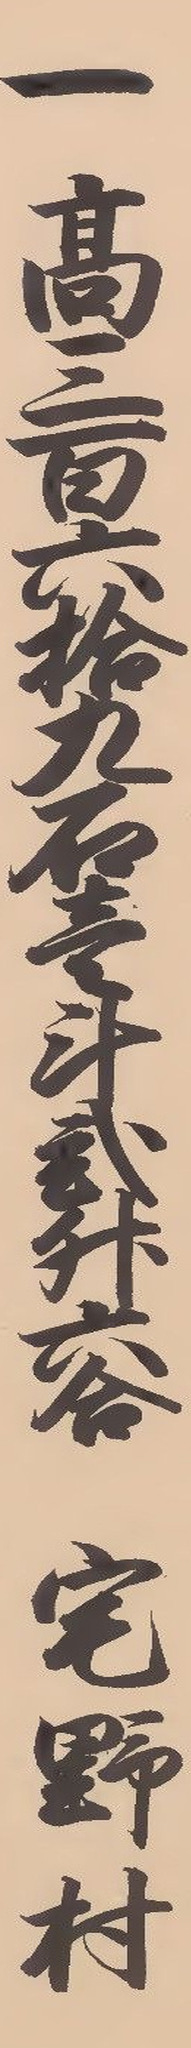一高三百六拾九石壱斗弐升六合宅野村
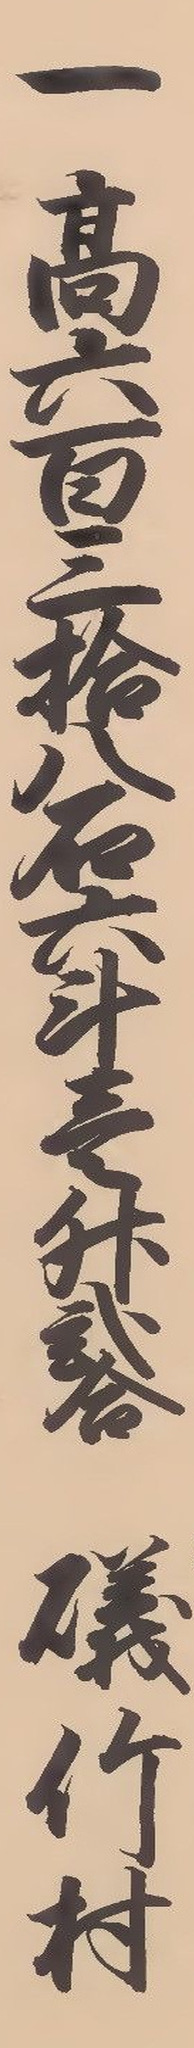一高六百三拾八石六斗壱升弐合磯竹村
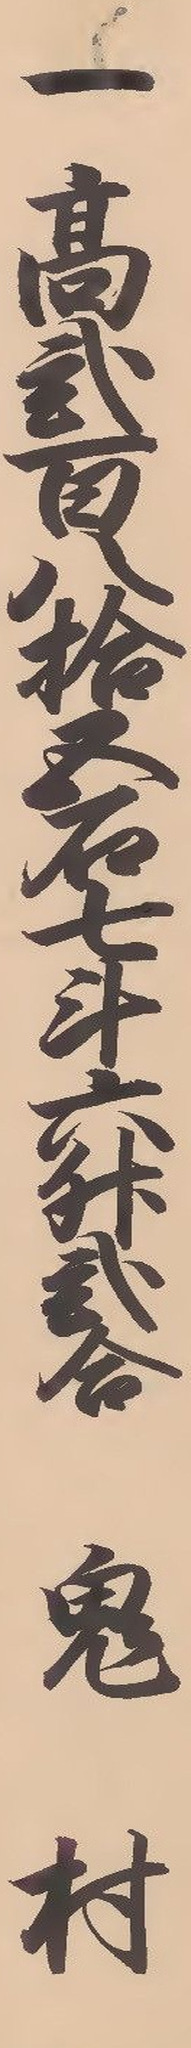一高弐百八拾五石七斗六升弐合鬼村
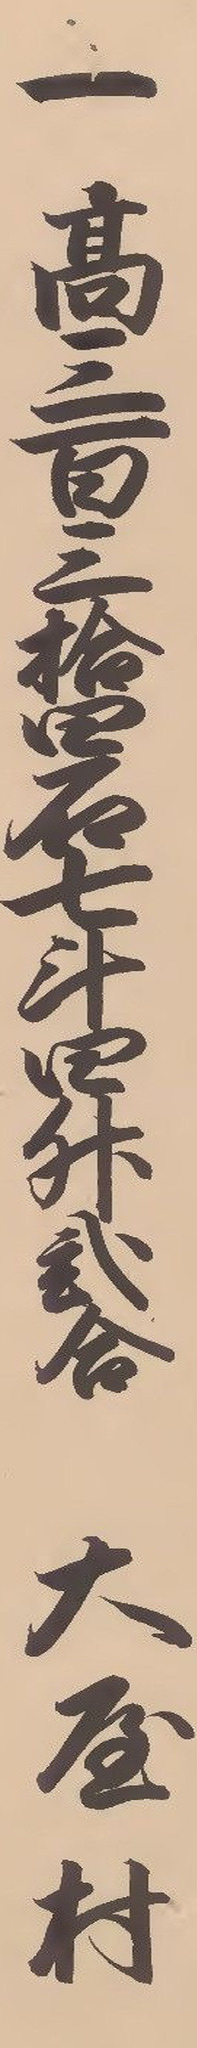一高三百三拾四石七斗四升弐合大屋村
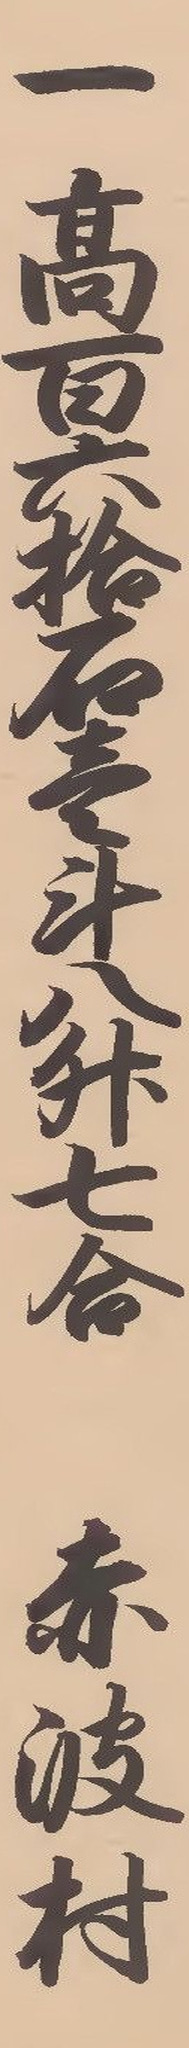一高百六拾石壱斗八升七合赤波村
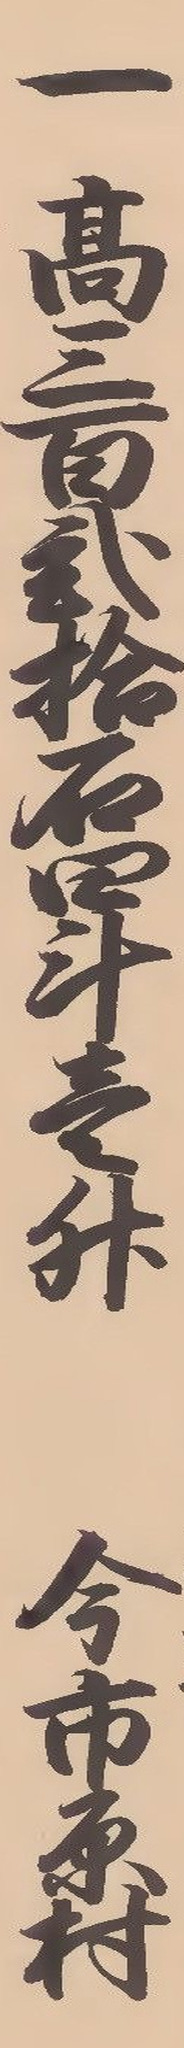一高三百弐拾石四斗壱升今市原村
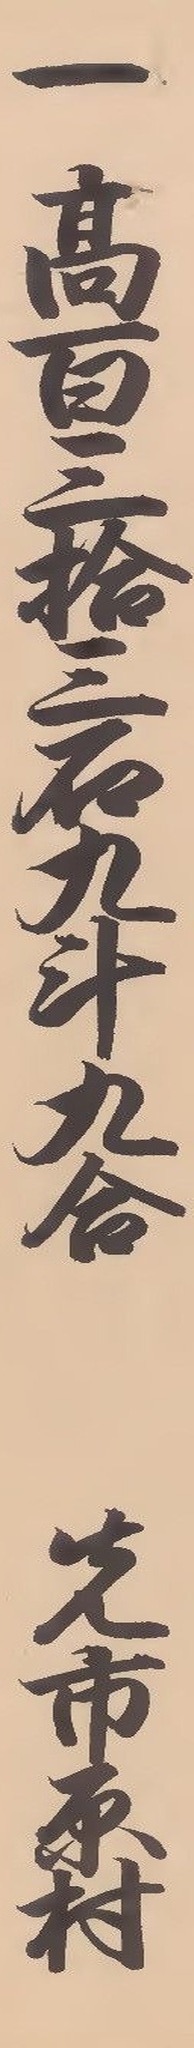一高百三拾三石九斗九合先市原村

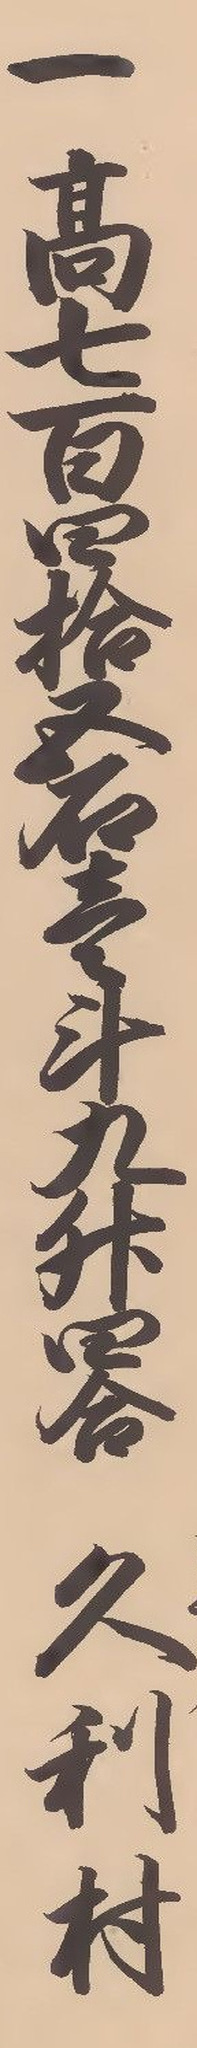一高七百四拾五石壱斗九升四合久利村
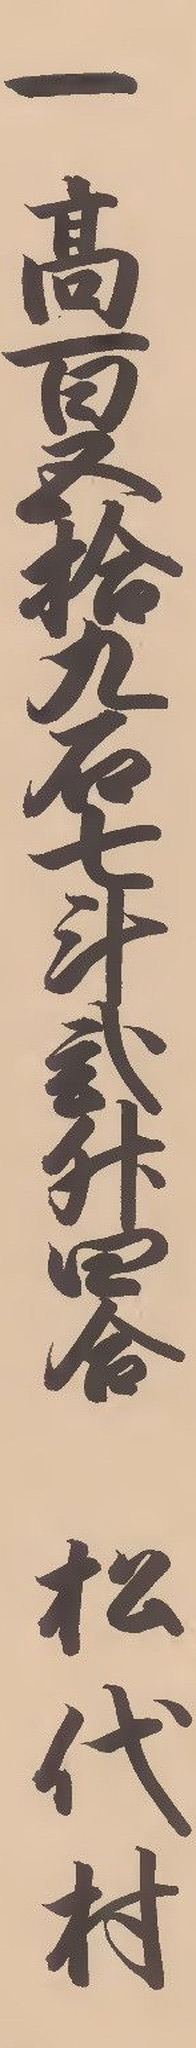一高百五拾九石七斗弐升四合松代村
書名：石見国郷帳
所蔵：国立公文書館 National Archives of Japan
